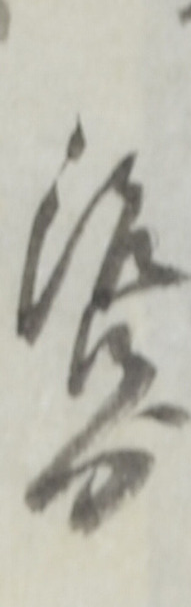治左衛門
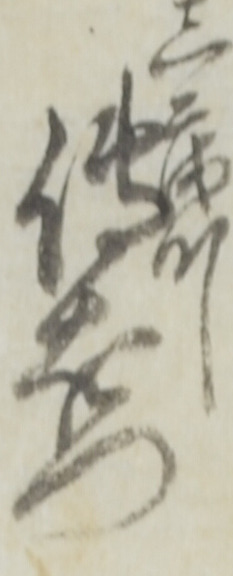常右衛門
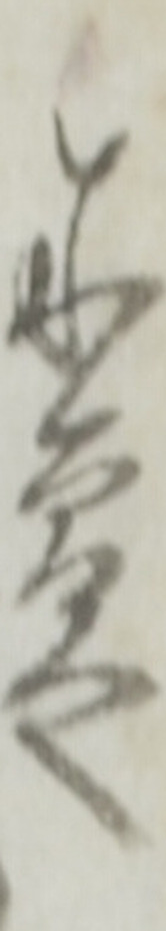木曽や
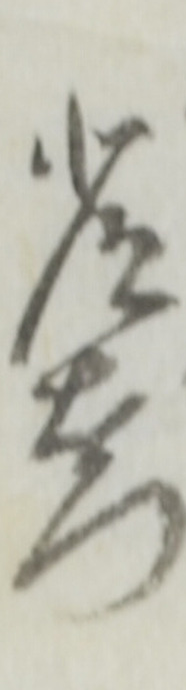常右衛門
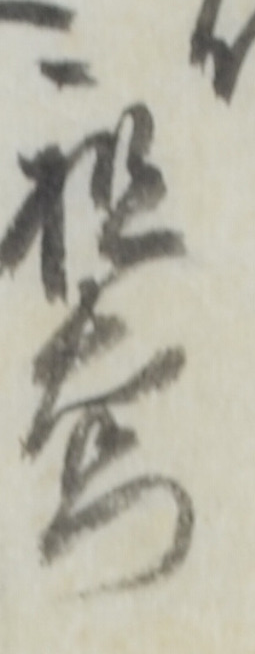常右衛門
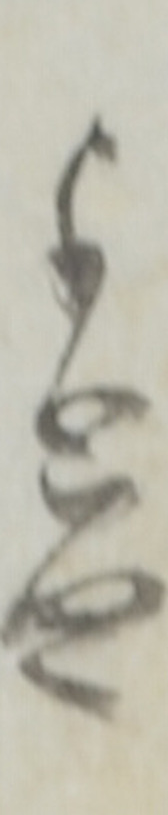よとや

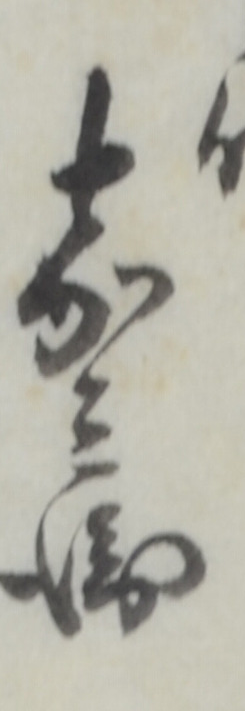茂兵衛
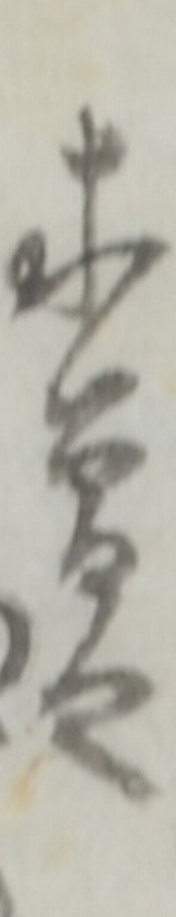木曽や
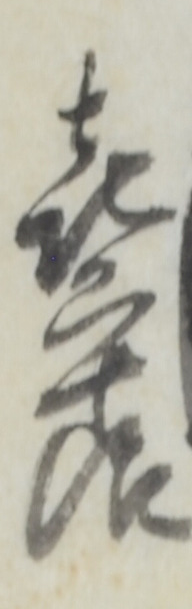茂兵衛
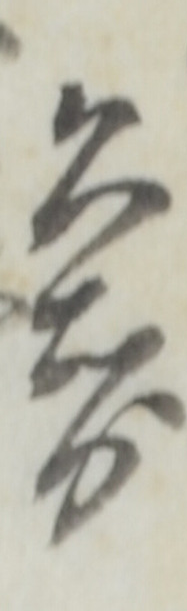久右衛門
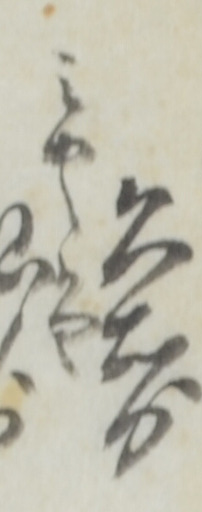久右衛門
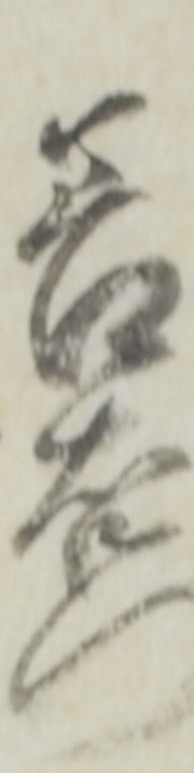久右衛門
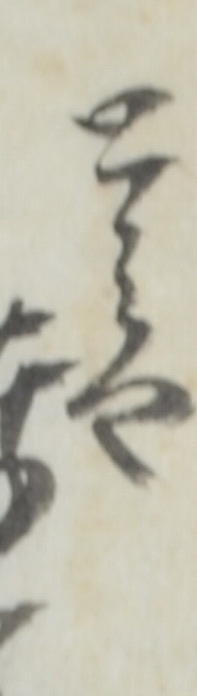とミや
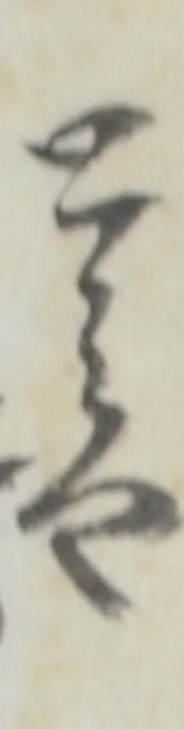とミや
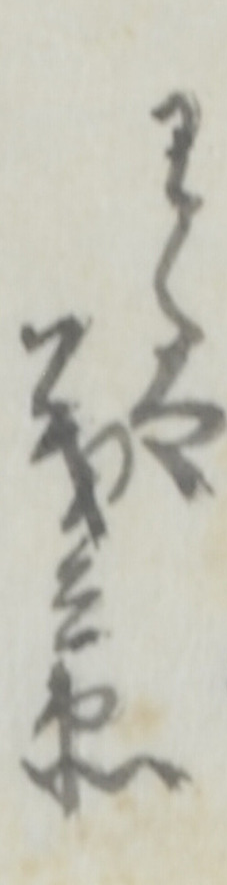茂兵衛
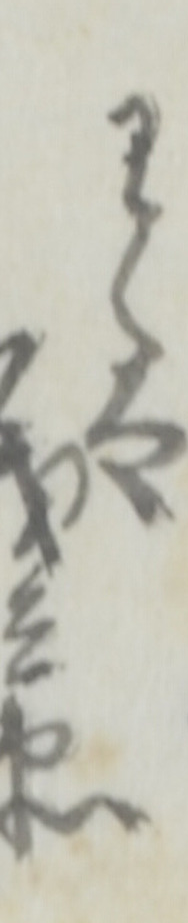こくや
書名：勧化人割帳
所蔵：伊那市立高遠町図書館・合同会社AMANE
